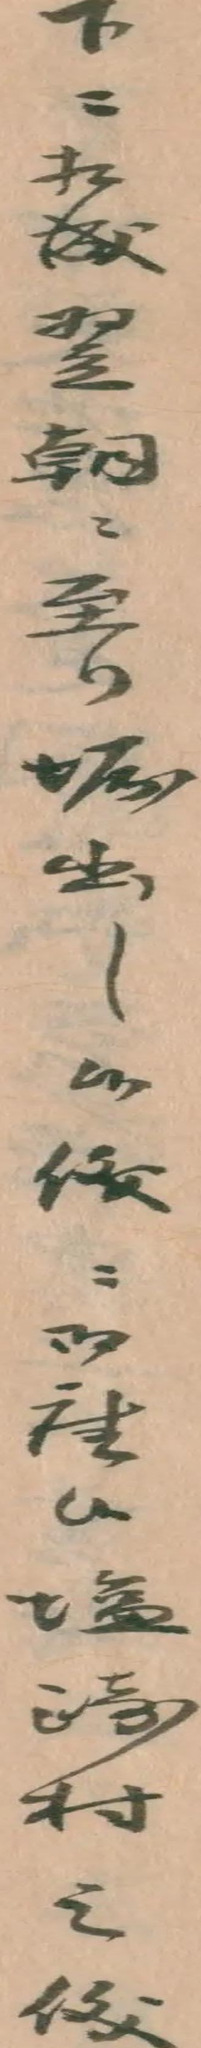下ニ相成翌朝ニ至り掘出し候儀ニ御座候塩崎村之儀
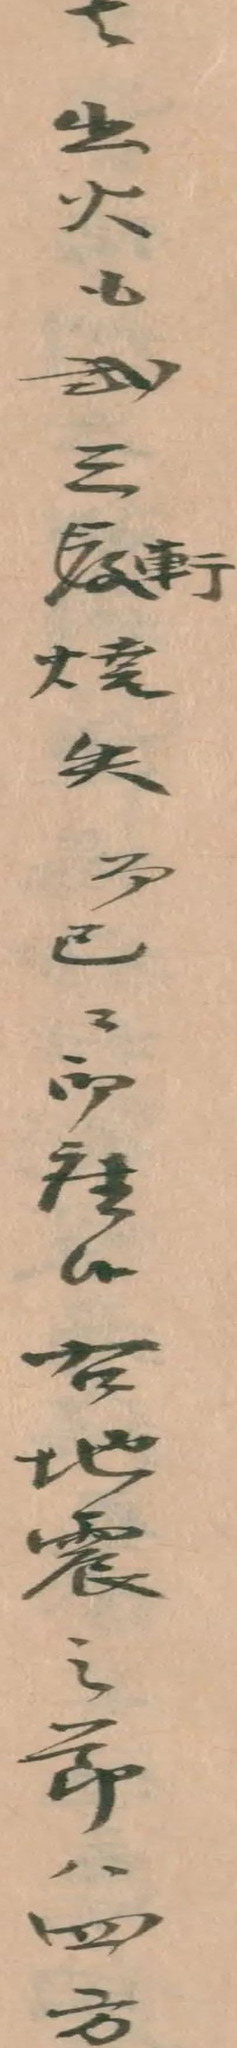者出火も弐三軒焼失而巳二御座候右地震之節は四方
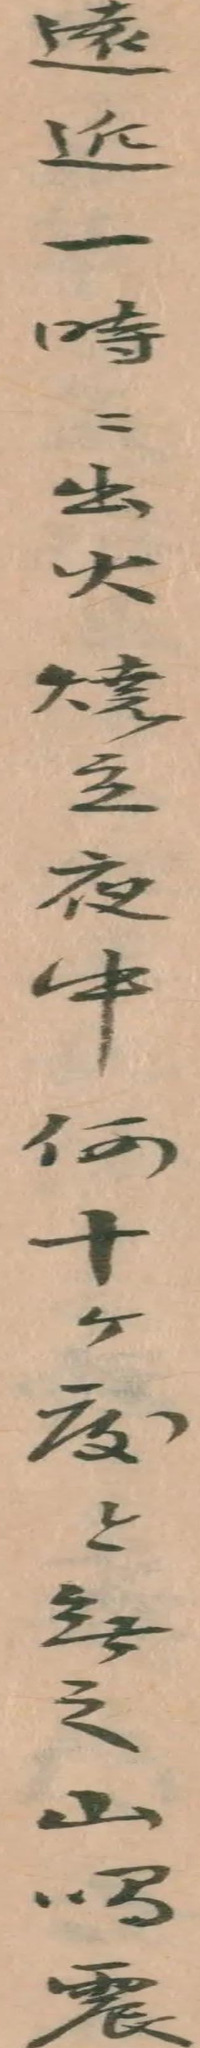遠近一時二出火焼立夜中何十ヶ度と無之山鳴震
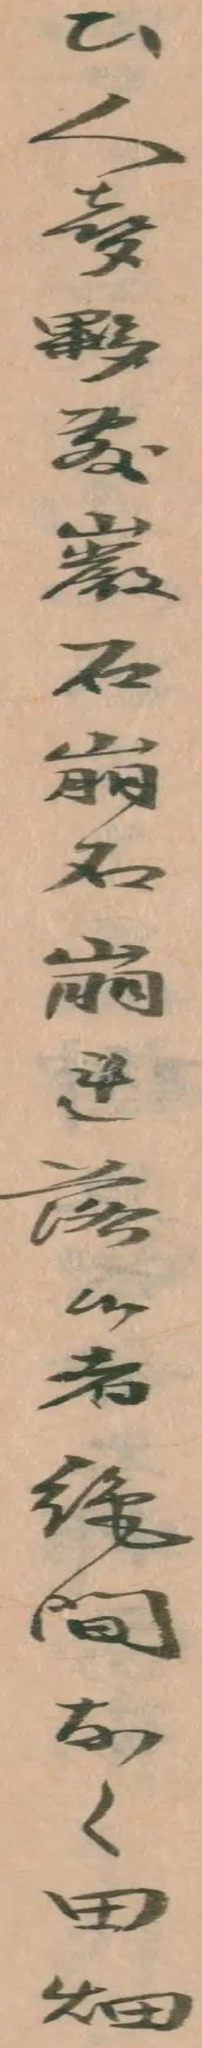ひ人声夥敷岩石崩石崩れ落候音絶間なく田畑
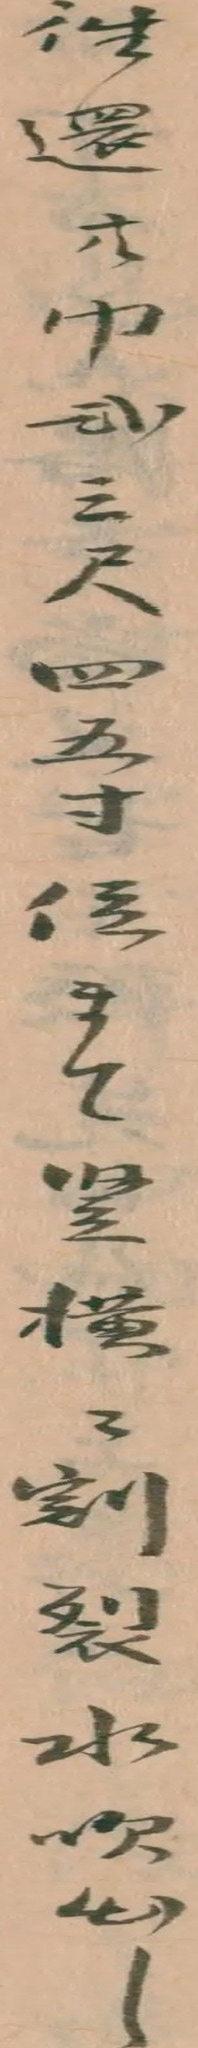往還共巾弐三尺四五寸位まて竪横ニ割裂水吹出し
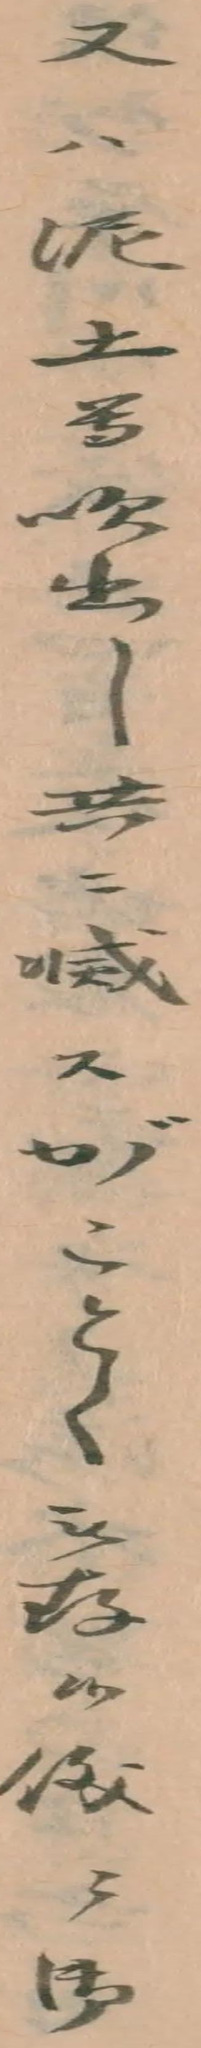又ハ泥土等吹出し共二滅スがごとく被存候儀ニ御
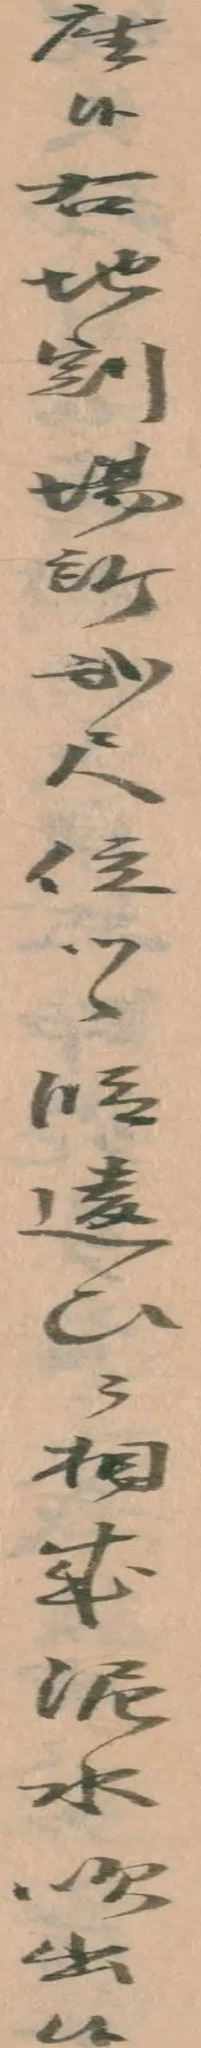座候右地割場所弐尺位ツゝ段違ひニ相成泥水吹出候
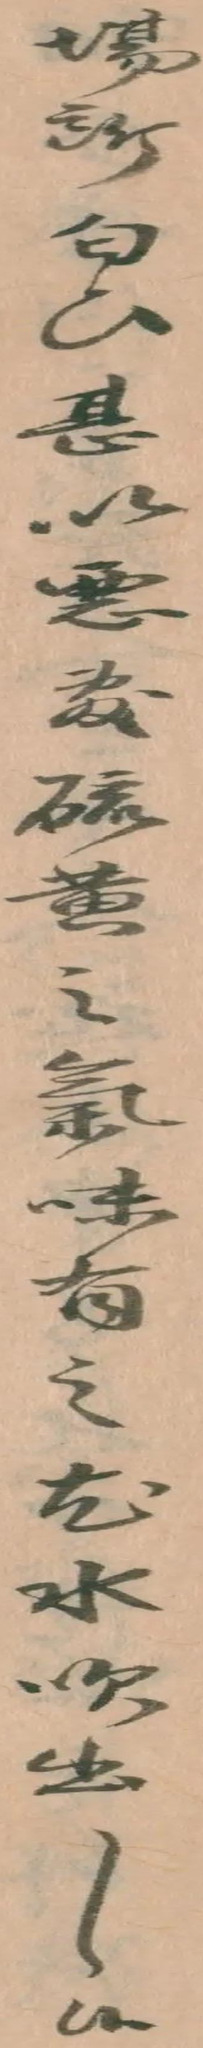場所匂ひ甚以悪敷硫黄之気味有之尤水吹出し候
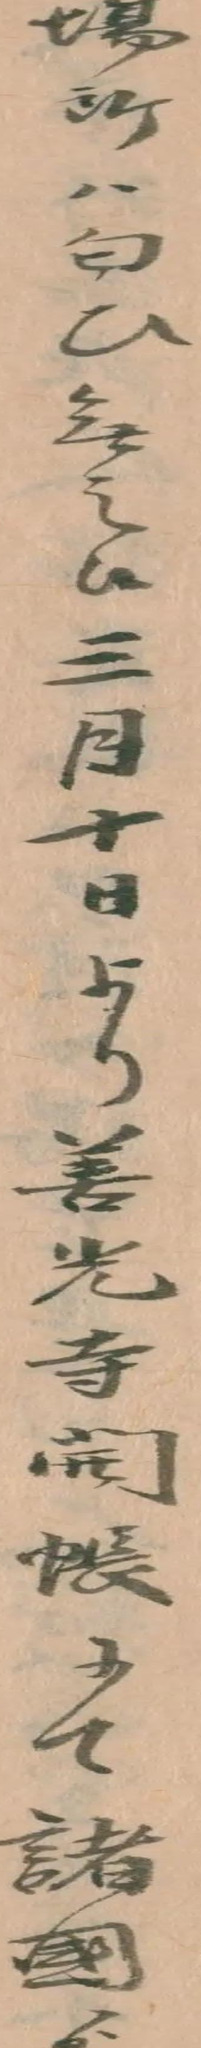場所ハ匂ひ無之候三月十日より善光寺開帳にて諸国ゟ
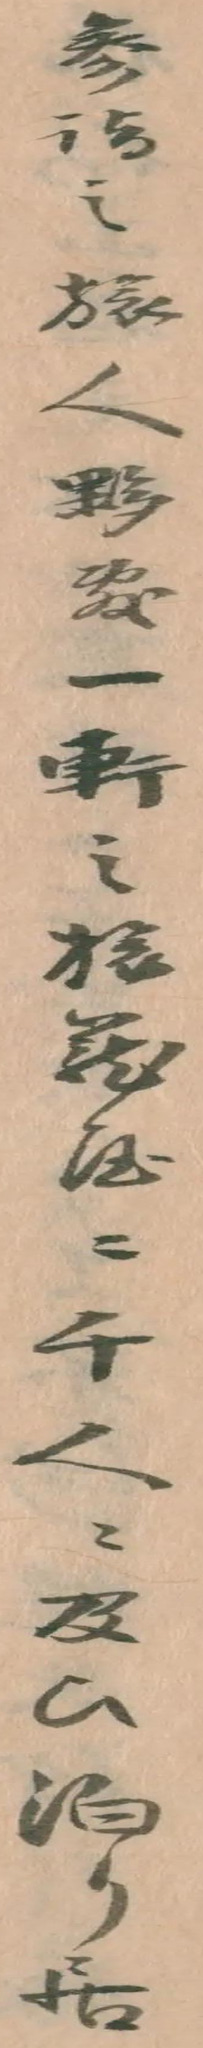参詣之旅人夥敷一軒之旅籠屋ニ千人二及び泊り居
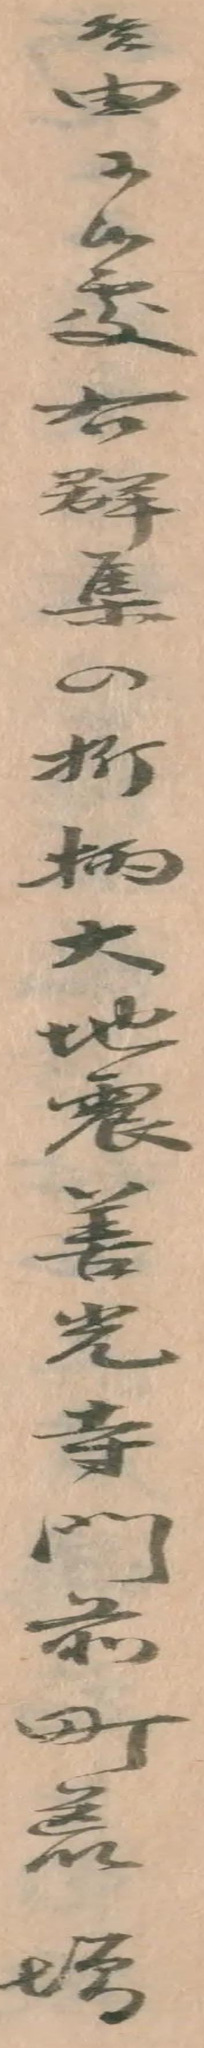候由二候処右群集の折柄大地震善光寺門前町荒増
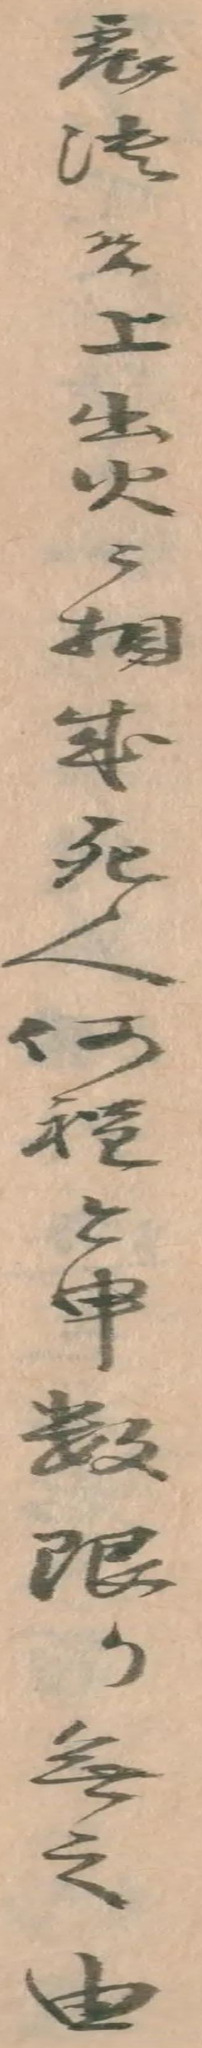震潰候上出火二相成死人何程と申数限り無之由
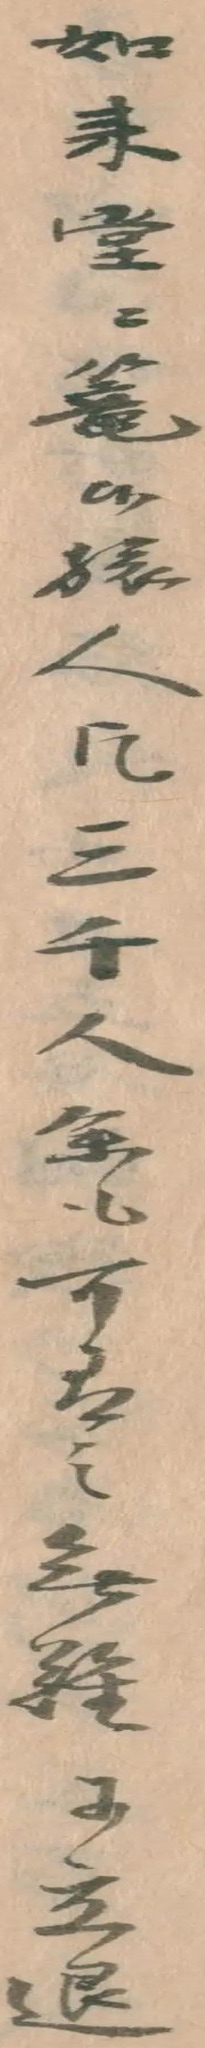如来堂ニ篭候旅人凡三千人余も可有之無難に立退
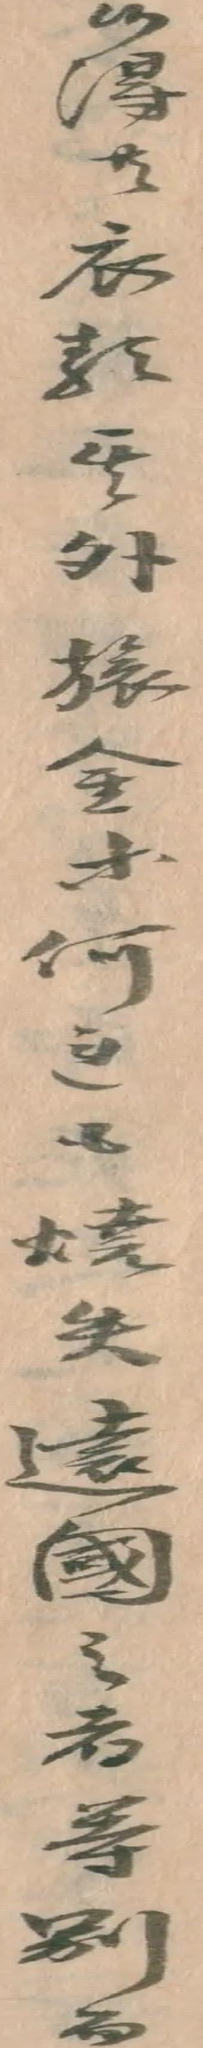候得共衣類其外旅金等何れも焼失遠国之者等別而
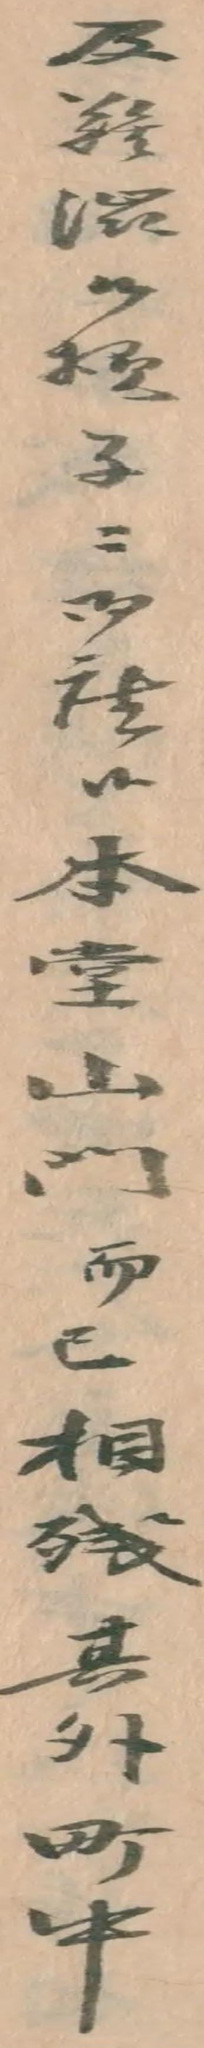及難渋ニ候様子ニ御座候本堂山門而已相残其外町中

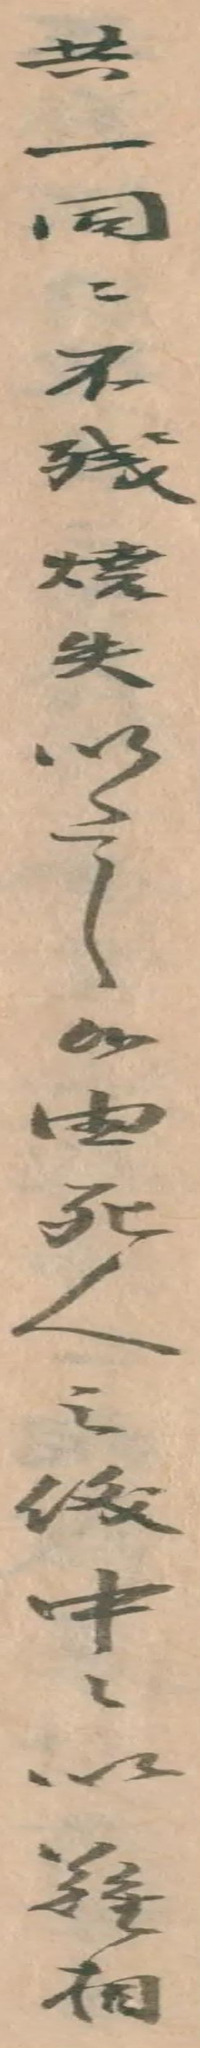共一同無残焼失いたし候由死人之義中々以難相
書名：地災撮要. 巻3(地震之部)-巻4(噴火之部)
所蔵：国立国会図書館 National Diet Library, JAPAN
